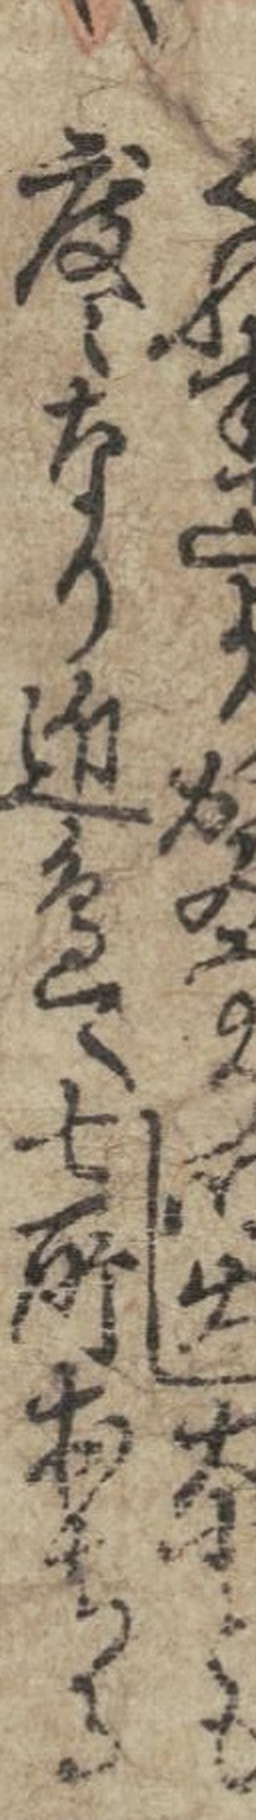度〻近辺の七所おちる
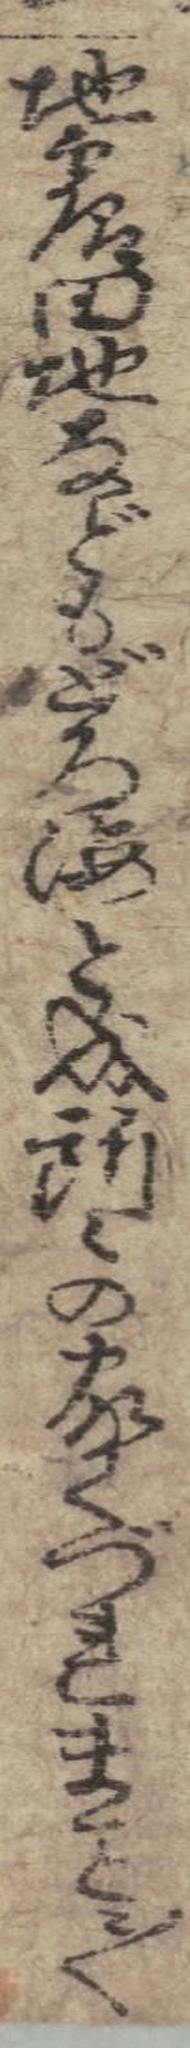地震田地などもどろ海と成所〻の家くづれまことに〳〵
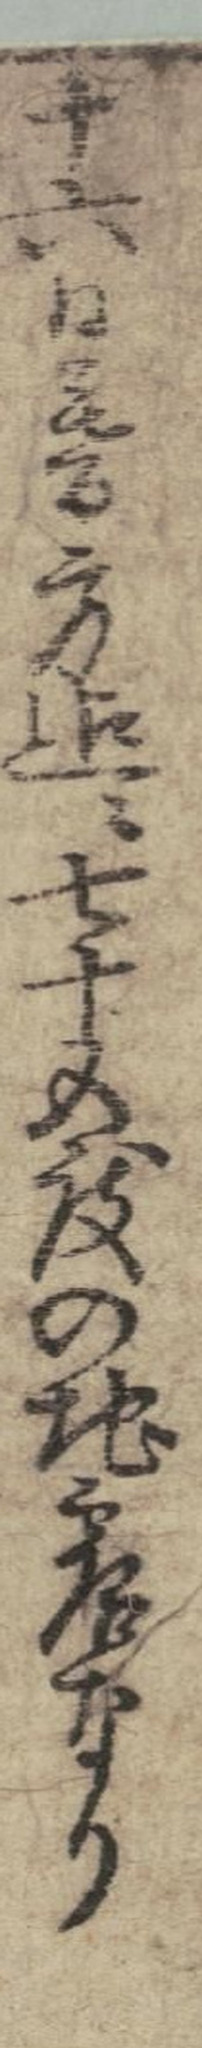十六日暮方迄に七十五度の地震なり
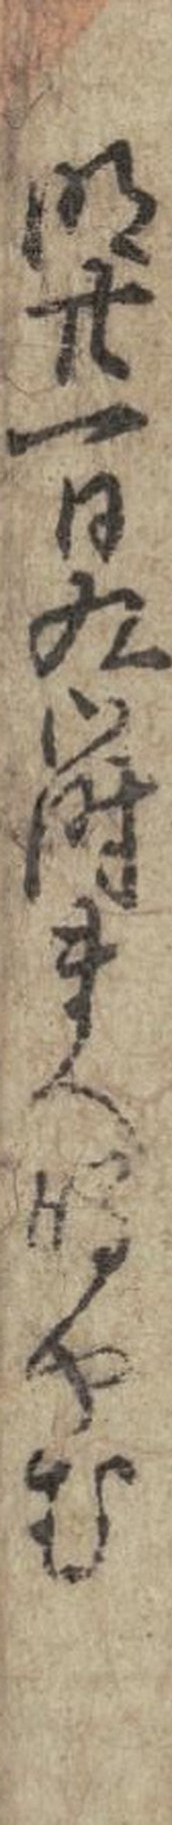明廿一日九ツ時まへ鳴やむ
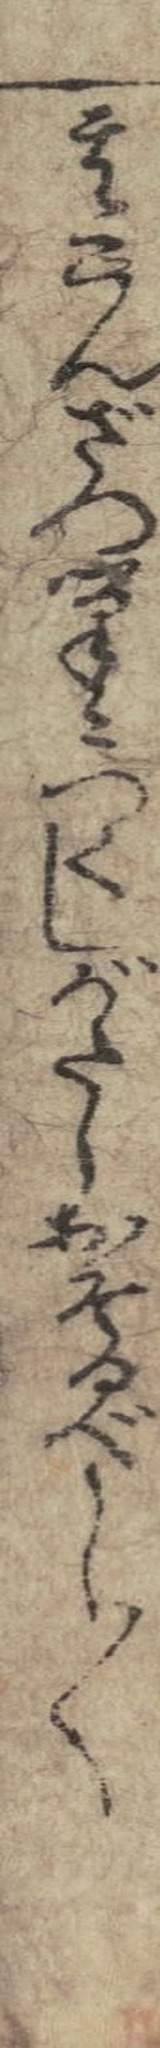其らんざつ筆につくしがたしおそるべし〳〵
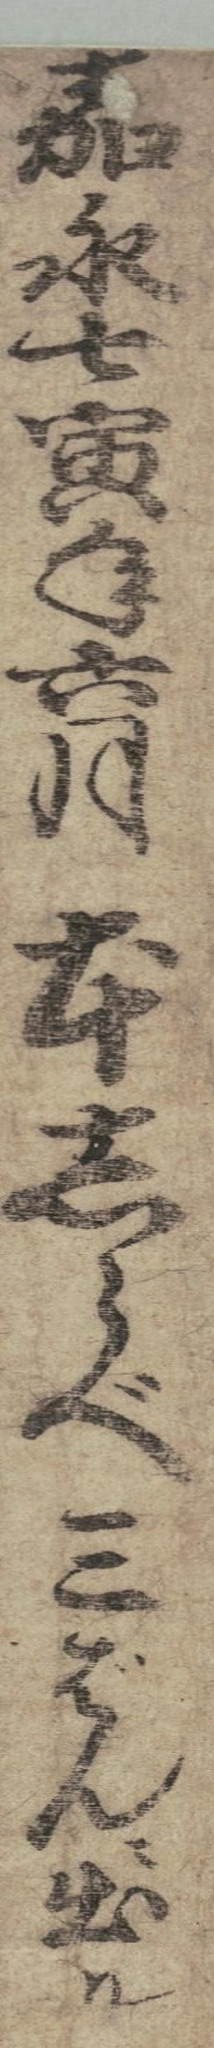嘉永七寅年六月本しらべ三ばんに出ル
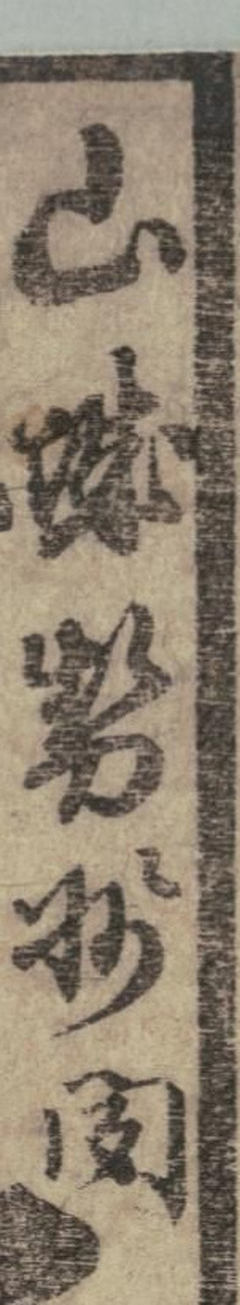山城勢州聞
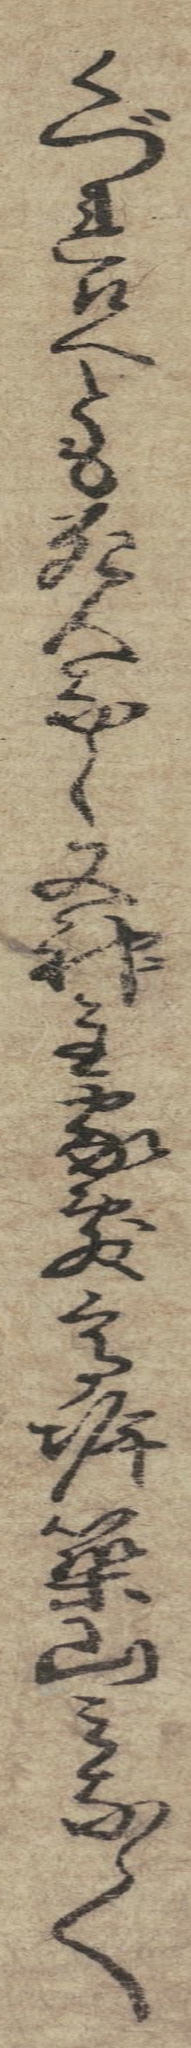くづれ候へとも死人なく又神主家敷高塀築山みな〳〵
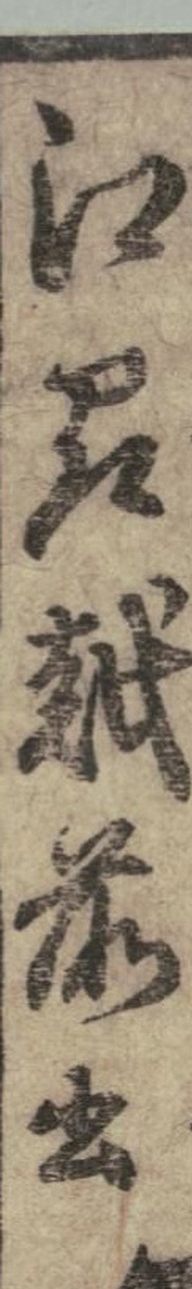江州越前書
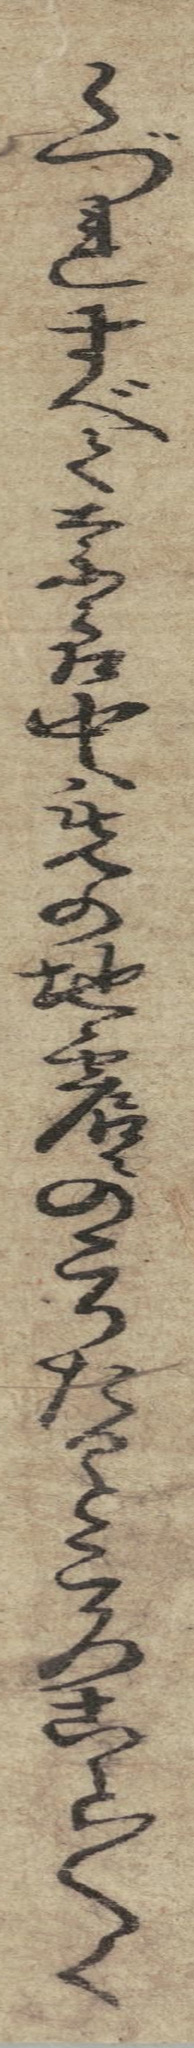くづれすべて奈良中は先の地震にのこりたるところこと〳〵く
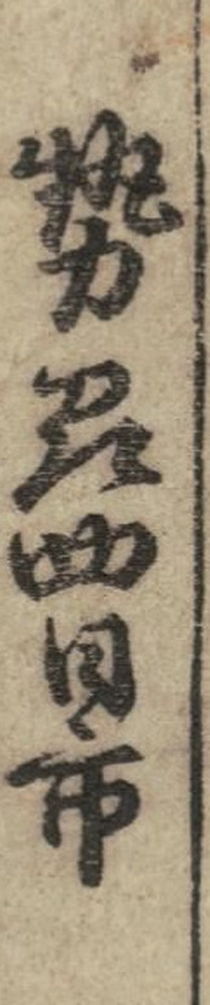勢州四日市
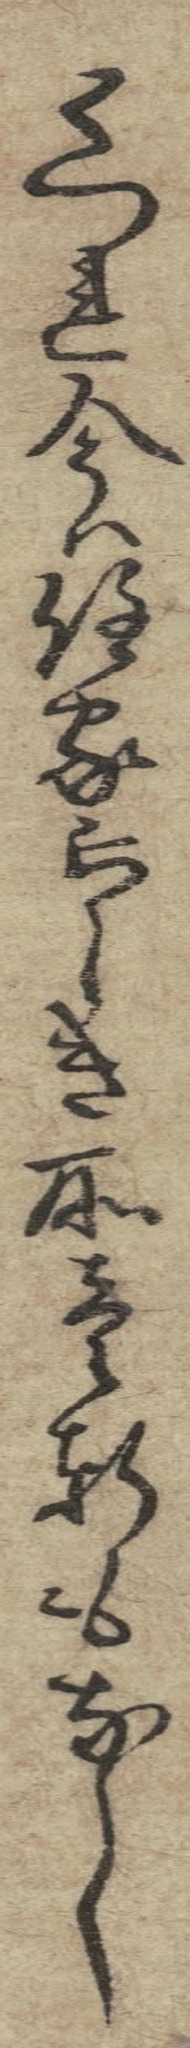くつれ今は住家らしき所壱軒もなし
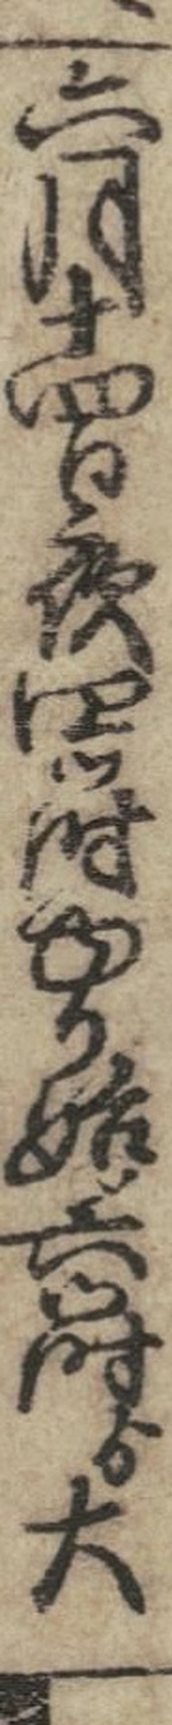六月十四日夜四ツ時ゆり始め六ツ時ゟ大
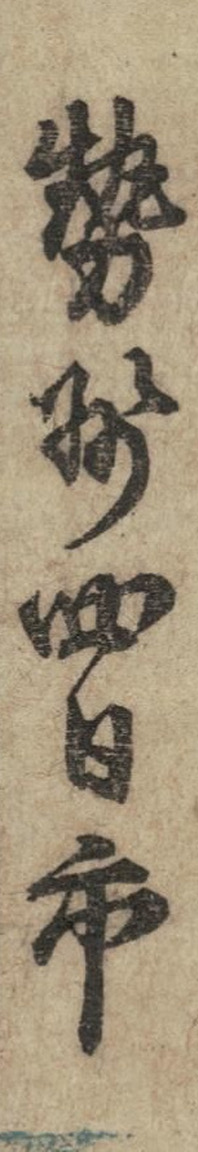勢州四日市
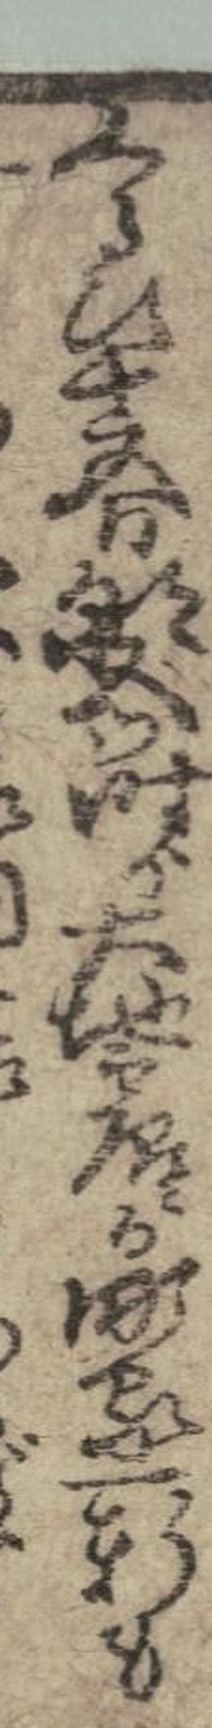くるひ十五日朝五ツ時ゟ大地震にて町家一軒も
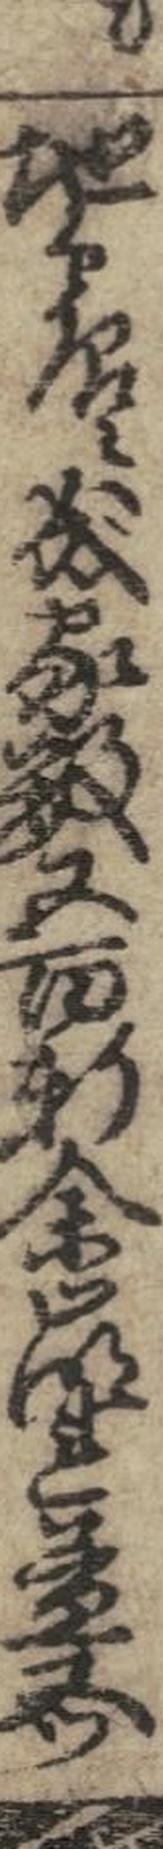地震に成家数五百軒余崩れ昼五ツ
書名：聞書　諸國大地震并ニ出火・早飛脚廻りにてくわしき所本しらべ　大地震・山城勢州大和三河江州越前　聞書　大地震並ニ出火の次第
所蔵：東京大学地震研究所図書室 Earthquake Research Institute Library, The University of Tokyo, JAPAN
